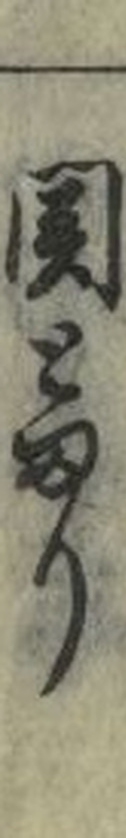関とまり
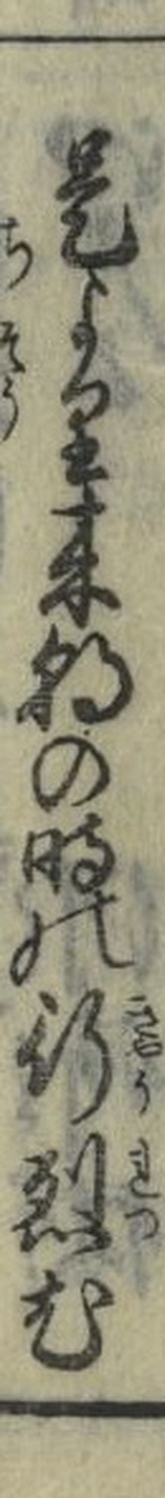是より来朝の時の行列ひ
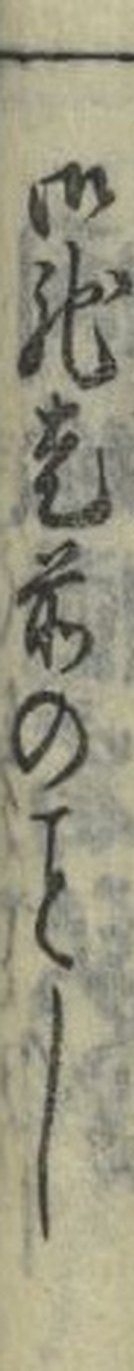御馳走前のことし
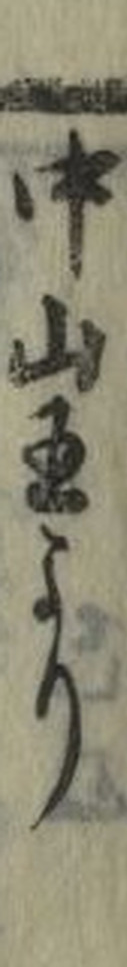中山王より
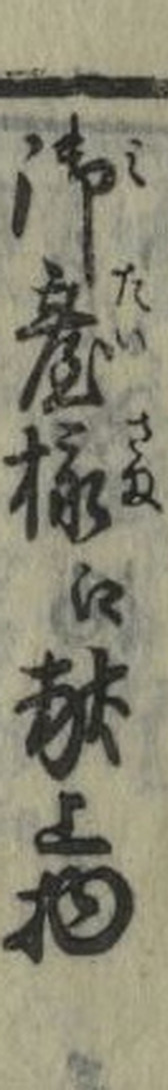御臺様え献上物
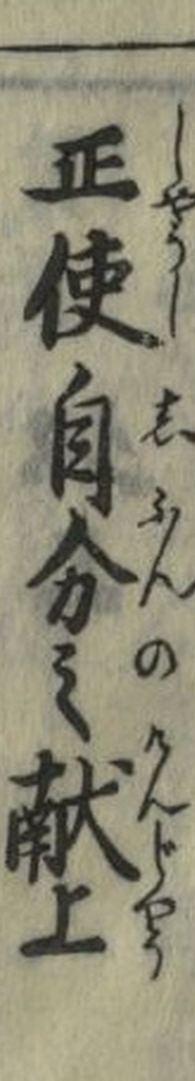正使自分之献上
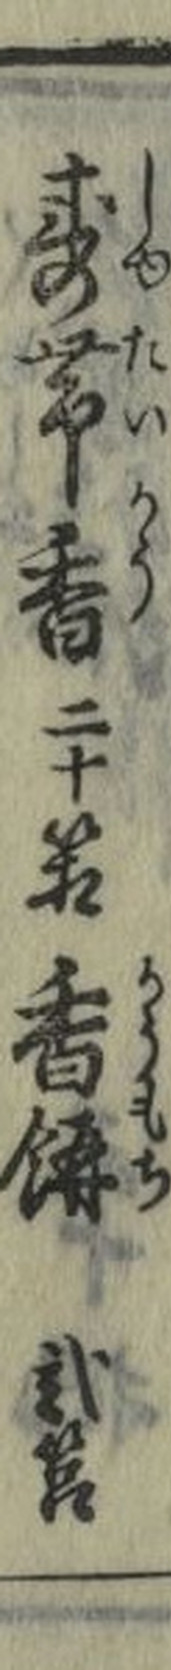寿帯香二十箱香餅弐箱
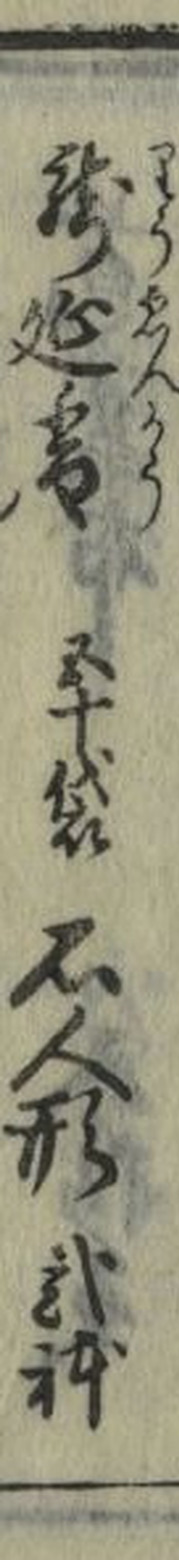龍涎香五十袋石人形弐躰
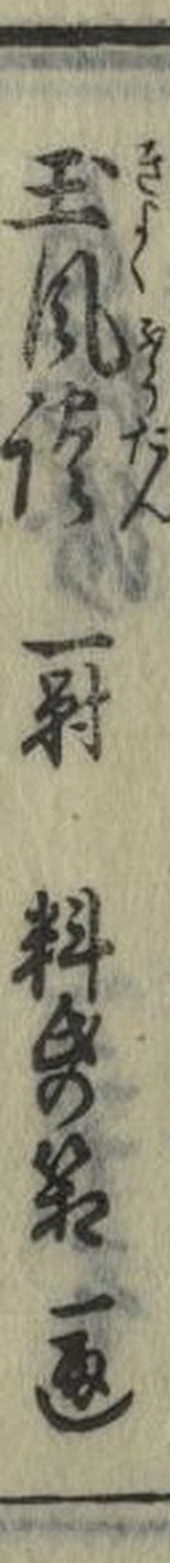玉風談一對料氏の箱一通
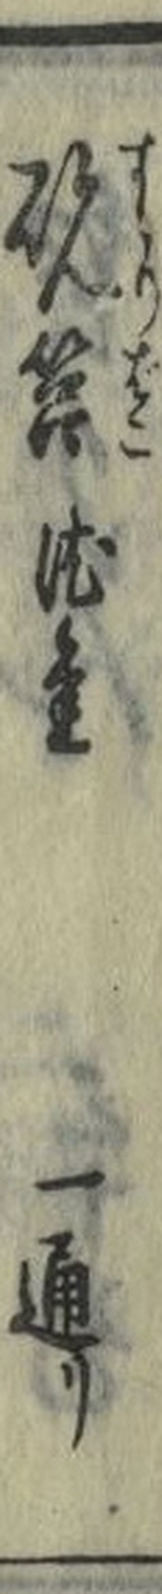硯箱沈金一通り
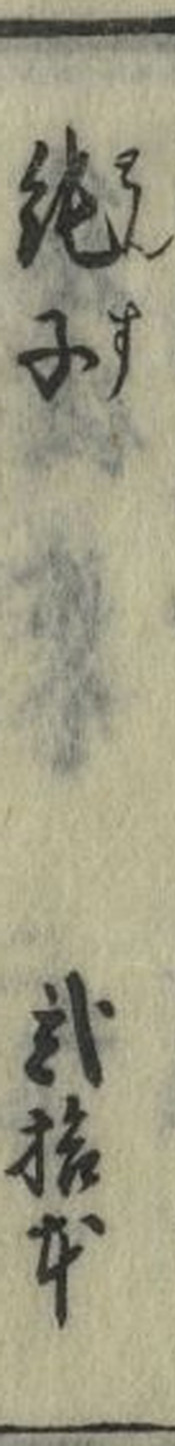鈍子弐拾本

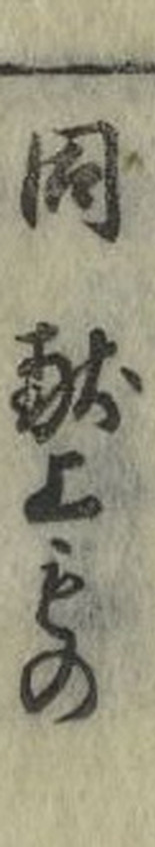同献上もの
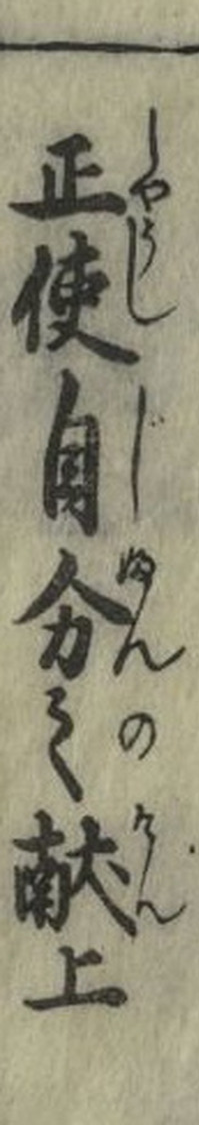正使自分之献上
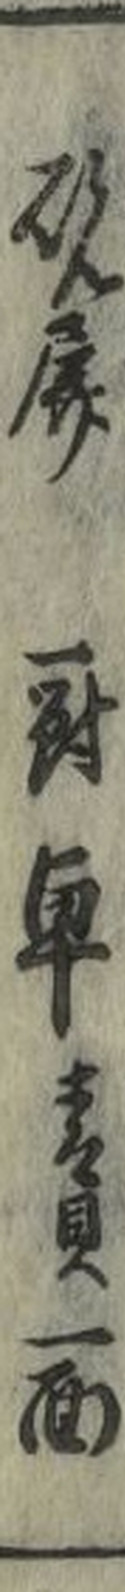硯屏一對卓青貝一面
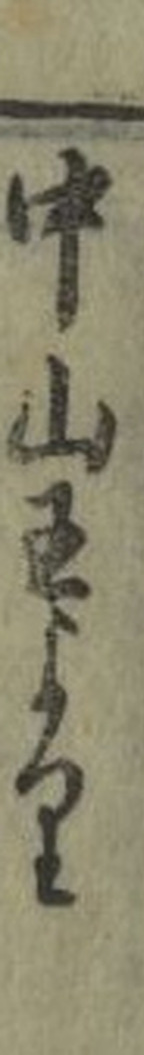中山王より
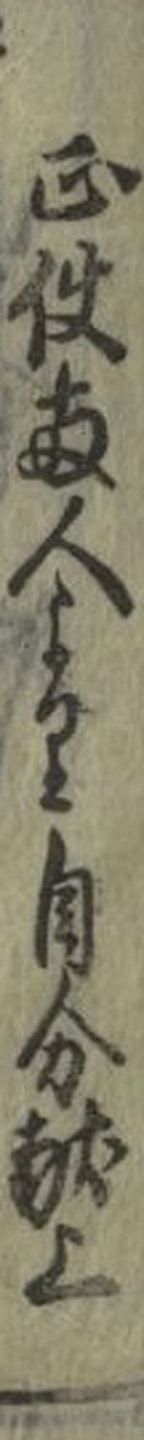正使両人より自分献上
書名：琉球人大行列記
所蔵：University of the Ryukyus Library
